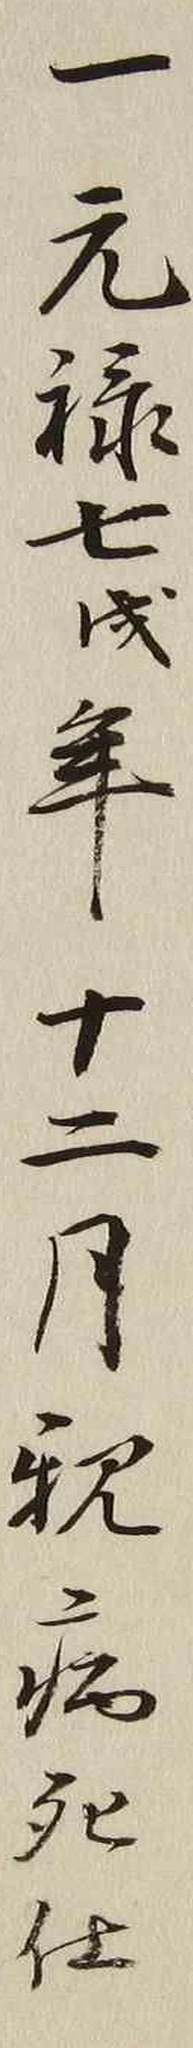一元禄七戌年十二月親病死仕り
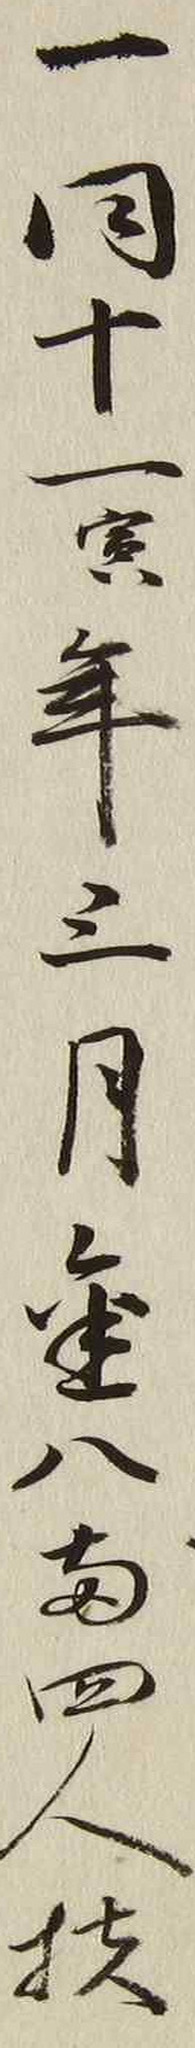一同十一寅年三月金八両四人扶
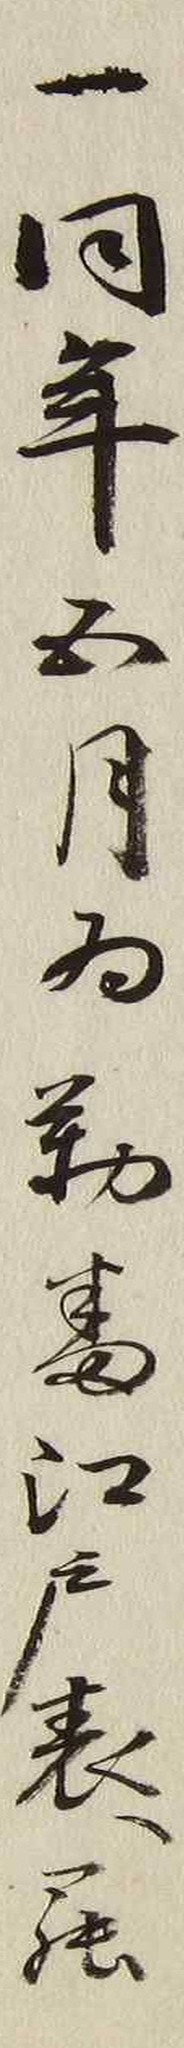一同年五月勤番之為江戸表へ罷り
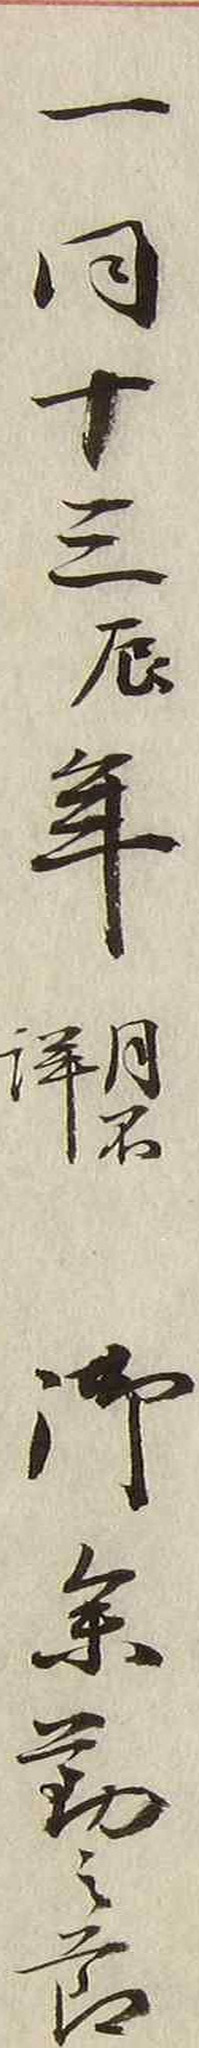一同十三辰年月不詳御参勤之節
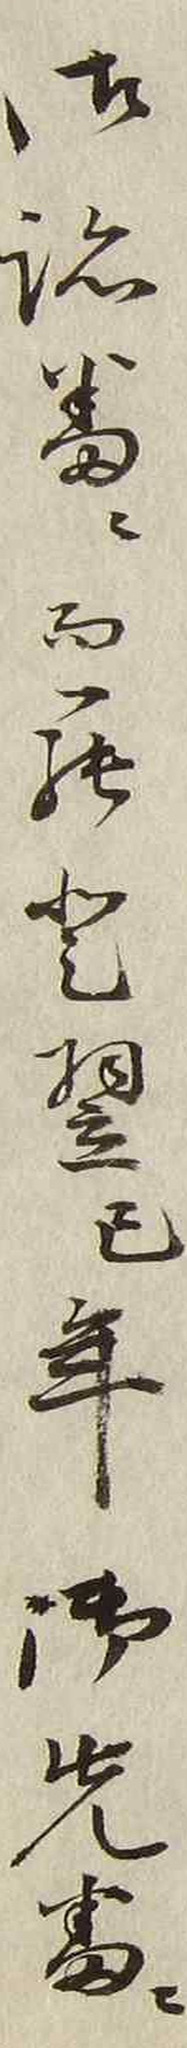御諸番ニて罷り登り翌巳年御先番ニ

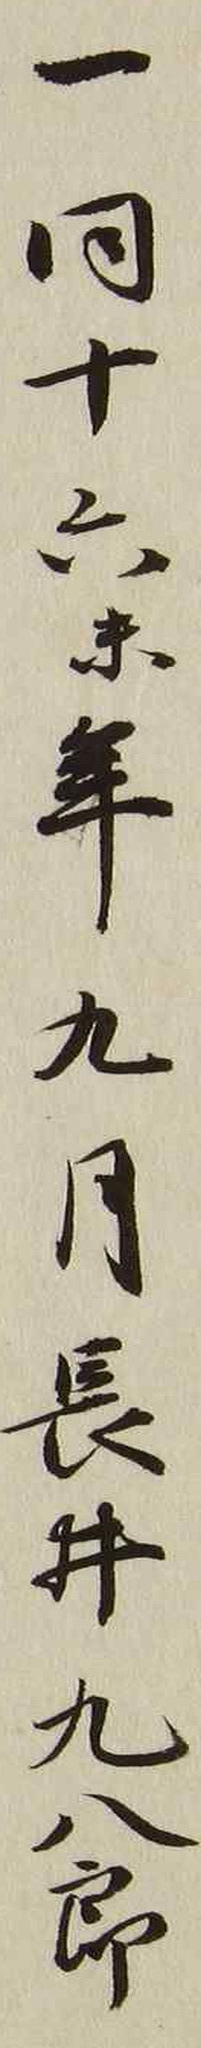一同十六未年九月な長井九八郎
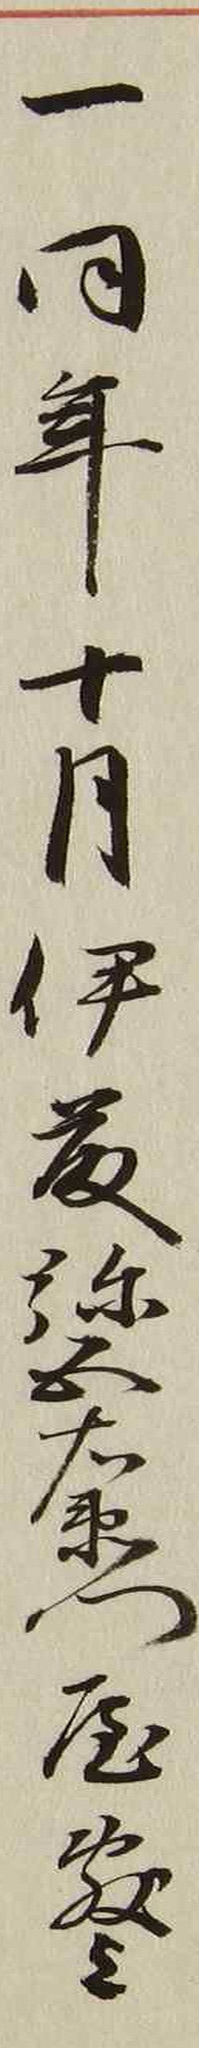一同年十月伊藤弥五右衛門屋敷と
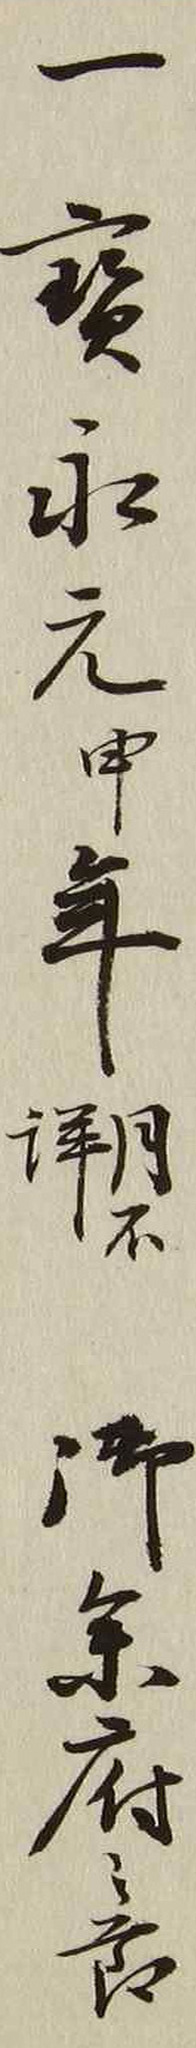一宝永元申年月不詳御参府之節
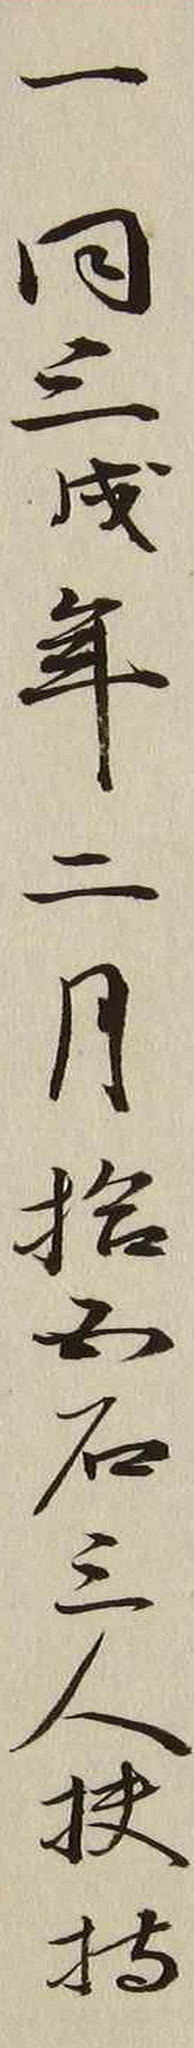一同三戌年二月拾五石三人扶持
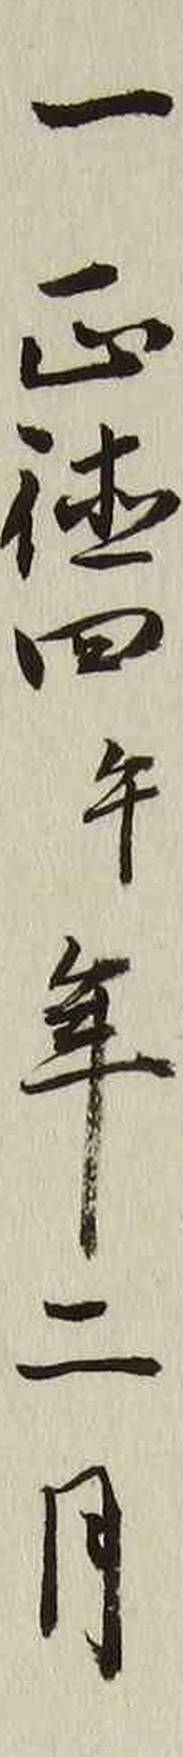一正徳四午年二月
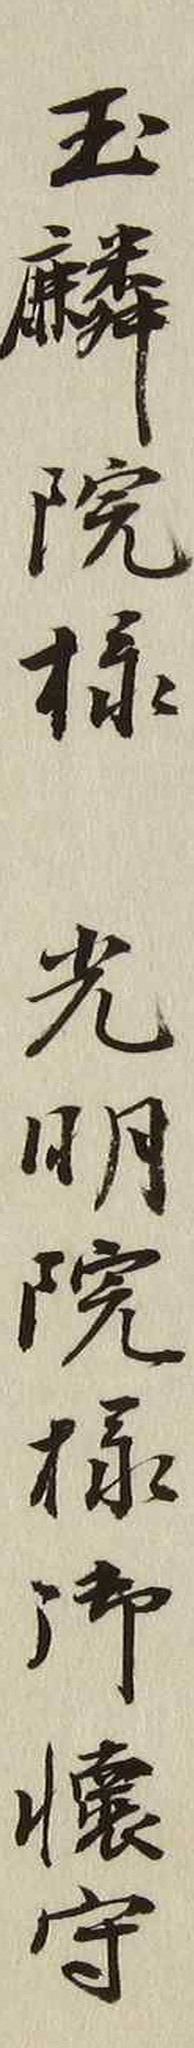玉麟院様光明院様御懐守
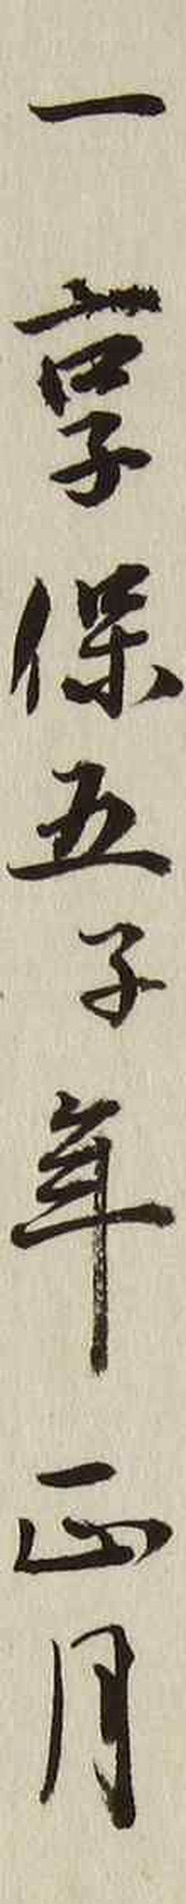一享保五子年正月
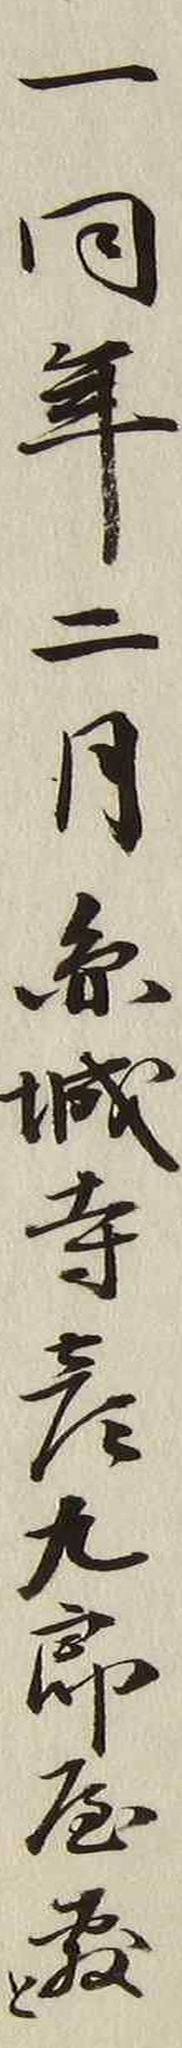一同年二月円城寺彦九郎屋敷と

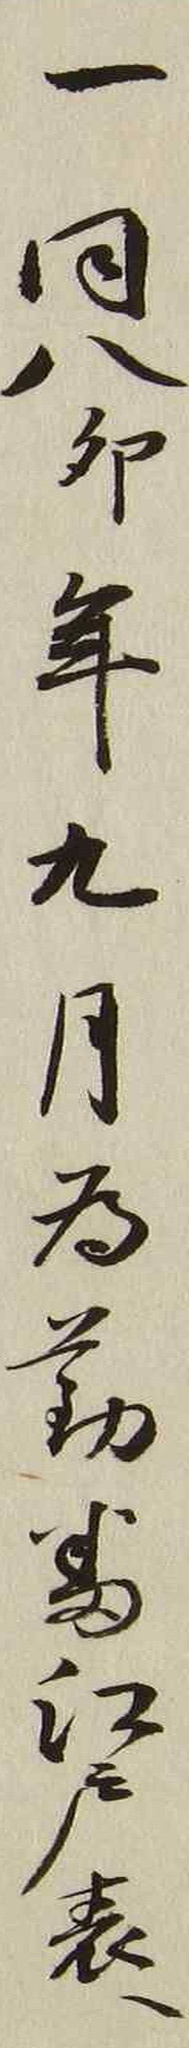一同八卯年九月勤番之為江戸表へ
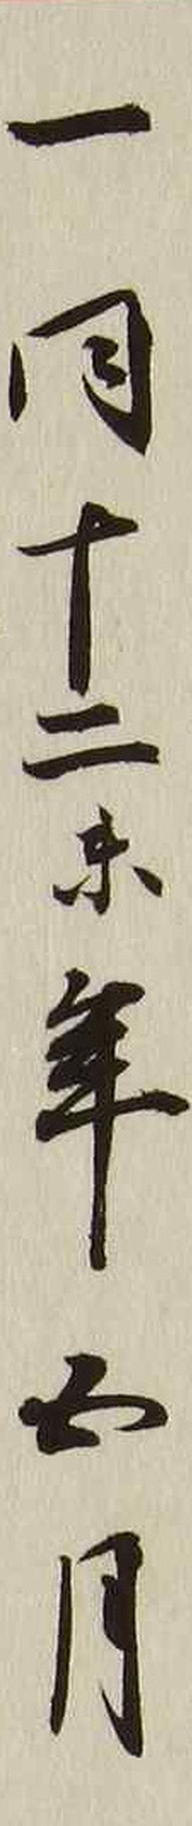一同十二未年五月
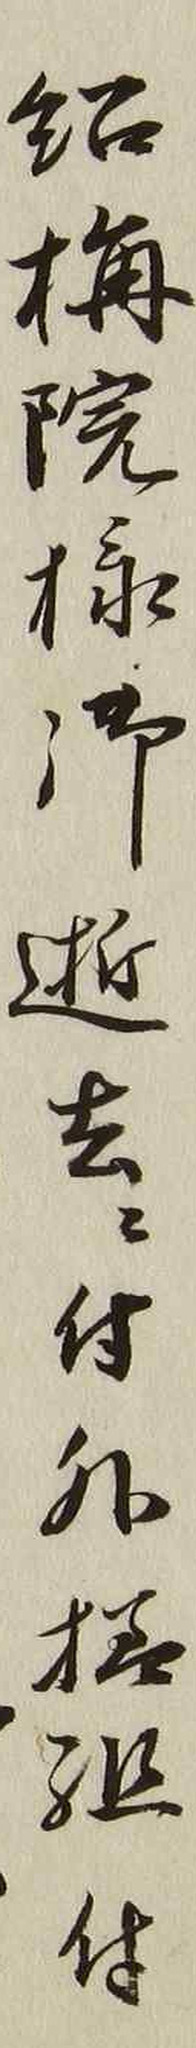紹桷院様御逝去ニ付き外様組付き
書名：諸士系譜　巻之19　い之部19
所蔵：会津若松市立会津図書館
